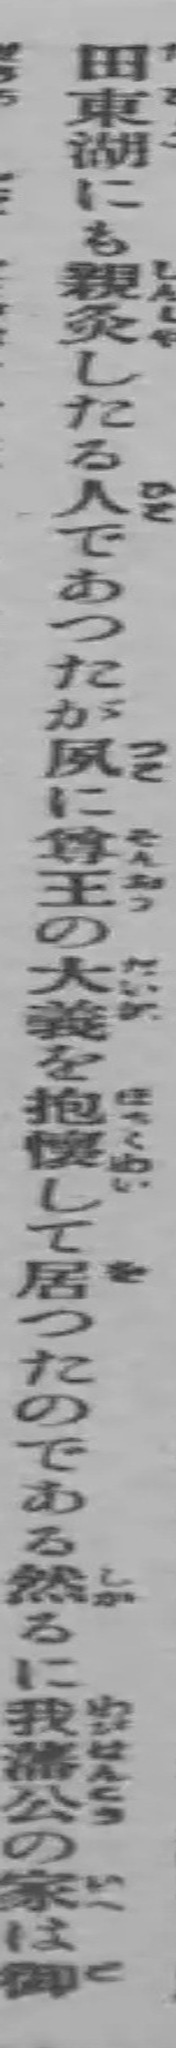田東湖にも親炙したる人であつたが夙に尊王の大義を抱懐して居つたのである然るに我藩公の家は御
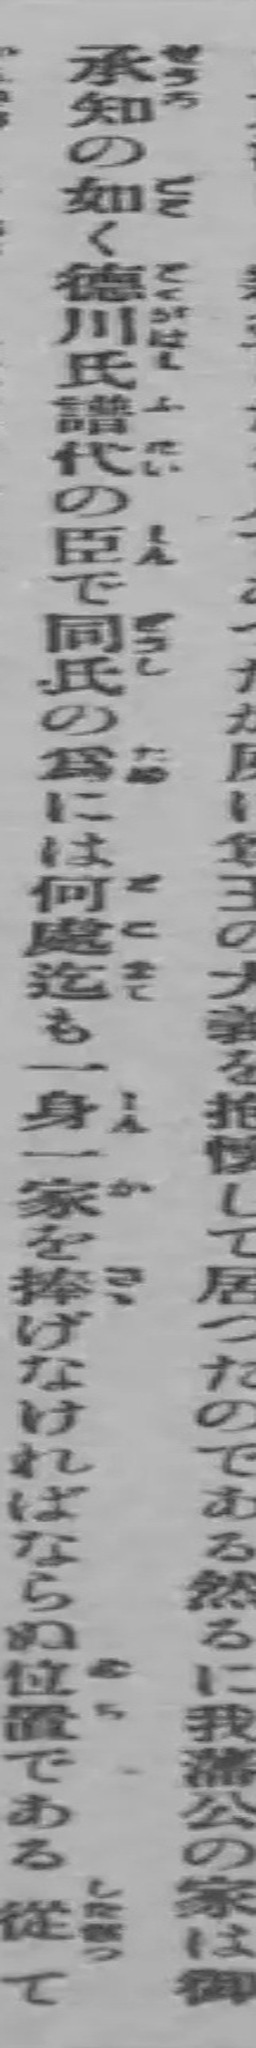承知の如く徳川氏譜代の臣で同氏の為に何処迄も一身一家を捧げなければならぬ位置である従て
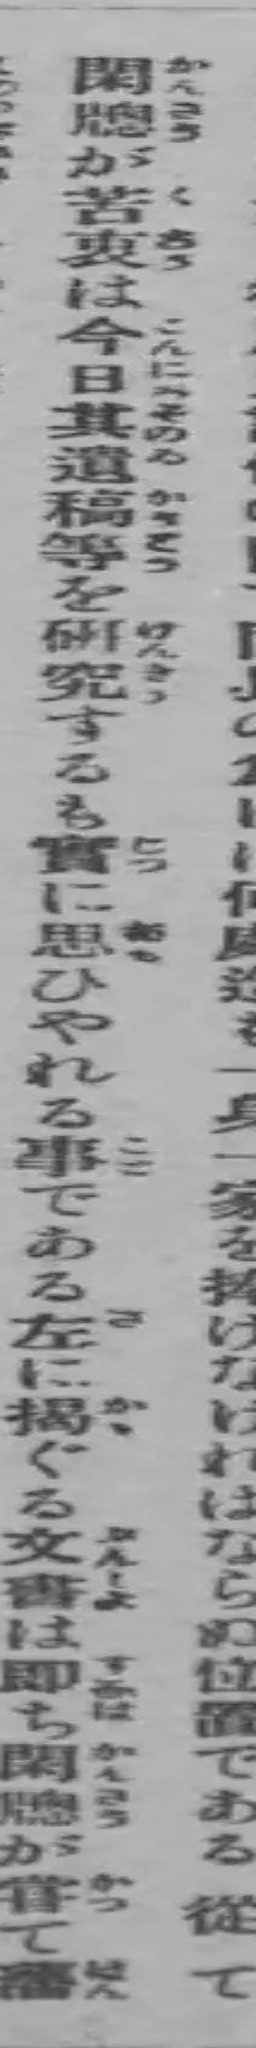閑牕が苦衷は今日其遺稿等を研究するも実に思ひやれる事である左に掲ぐる文書は即ち閑牕が嘗て藩
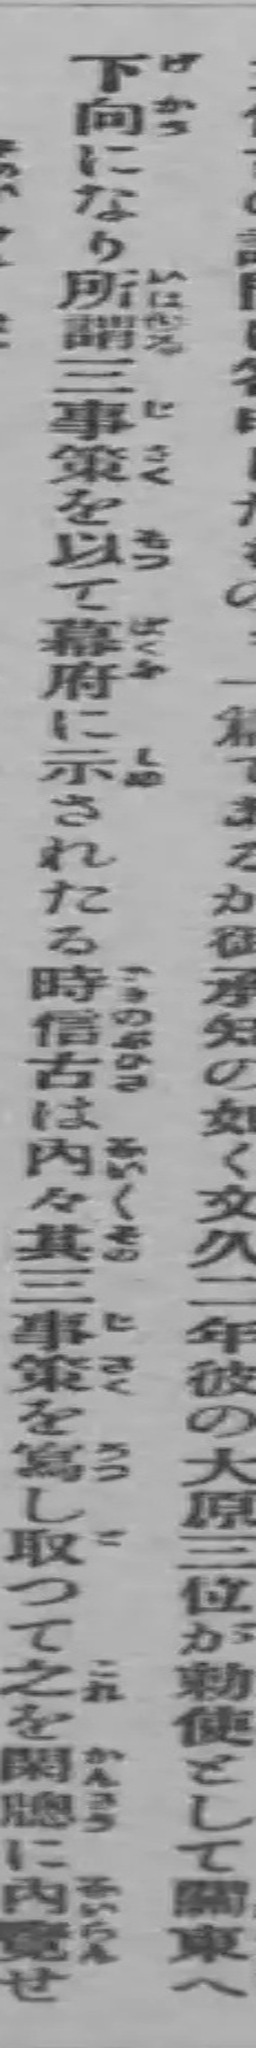下向になり所謂三事策を以て幕府に示されたる時信古は内々其三事策を写し取つて之を閑牕に内覧せ
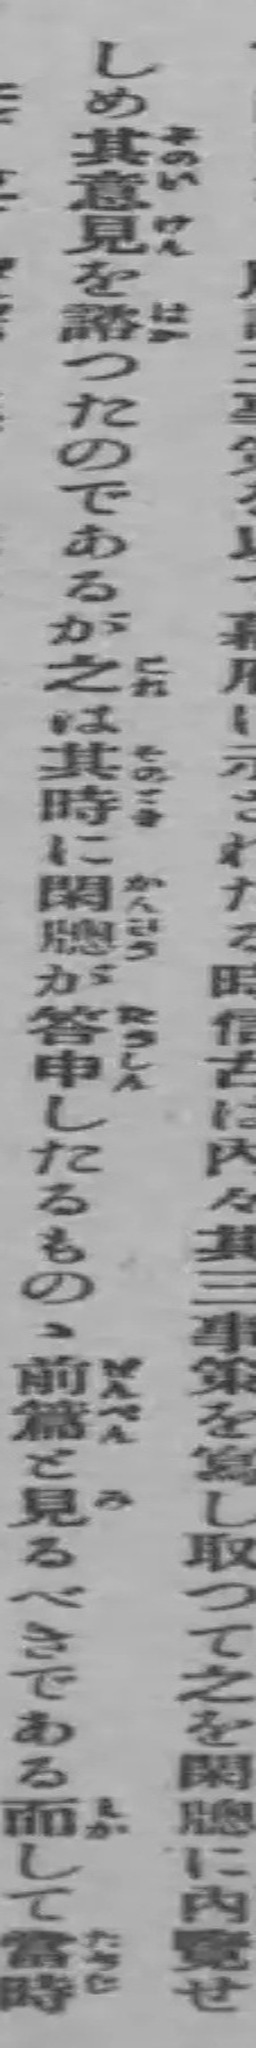しめ其意見を諮つたのであるが之は其時に閑牕が答申したるものゝ前篇と見るべきである而して当時
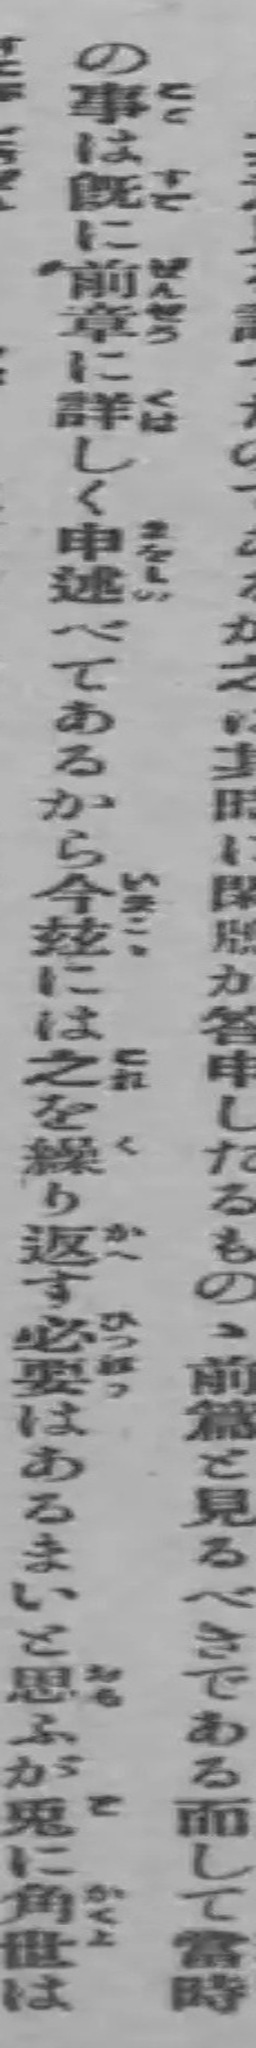の事は既に前章に詳しく申述べてあるから今茲には之を繰り返す必要はあるまいと思ふが兎に角世は
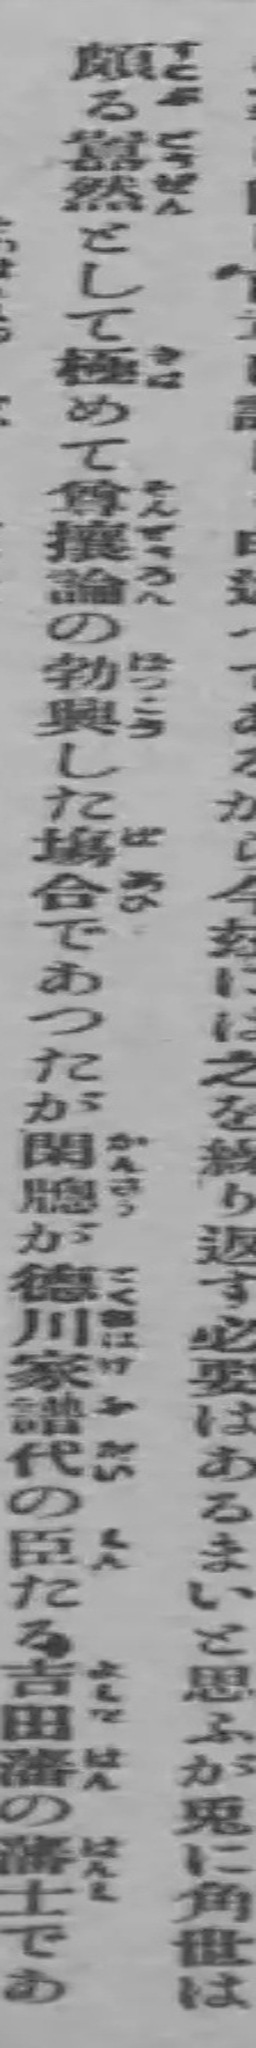頗る囂然として極めて尊攘論の勃興した場合であつたが閑牕が徳川家譜代の臣たる吉田藩の藩士であ
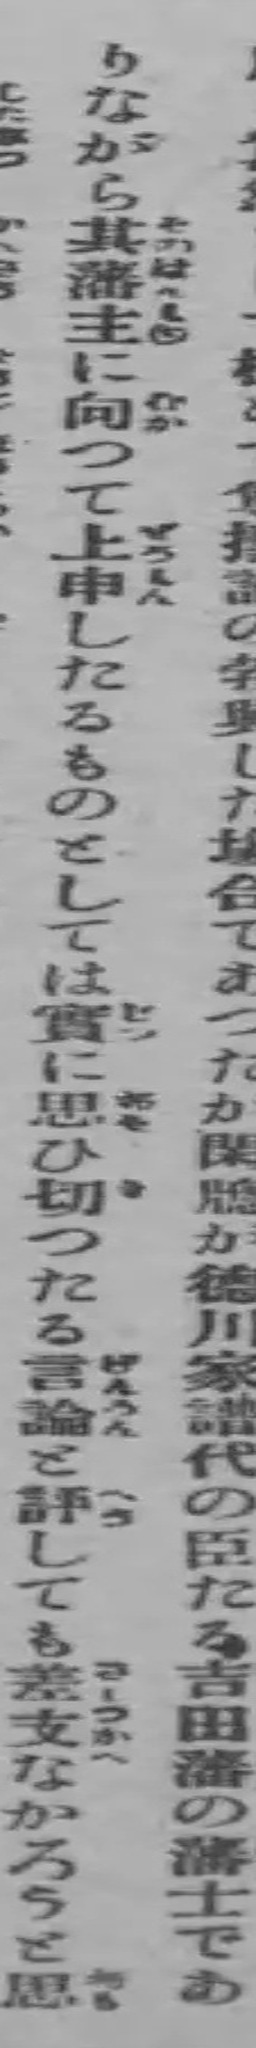りながら其藩主に向つて上申したるものとしては実に思ひ切つたる言論と評しても差支なかろうと思
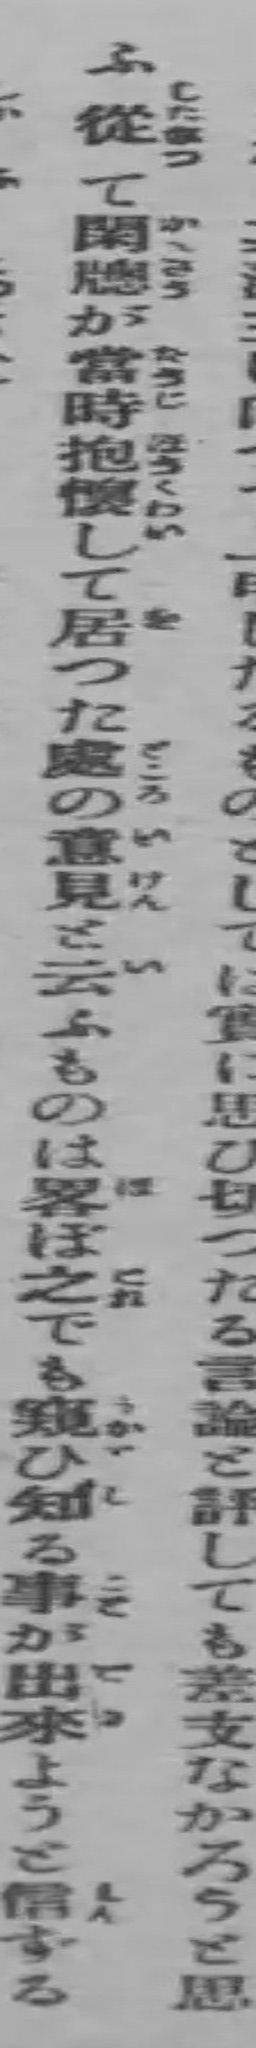ふ従て閑牕が当時抱懐して居つた処の意見と云ふものは略ぼ之でも窺ひ知る事が出来ようと信ずる
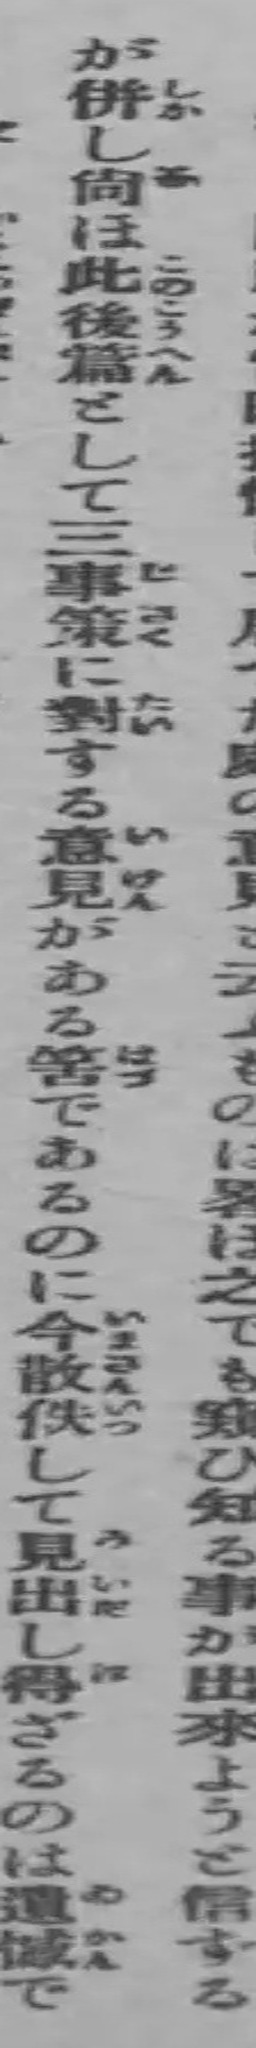が併し尚ほ此後篇として三事策に対する意見がある筈であるのに今散佚して見出し得ざるのは遺憾で
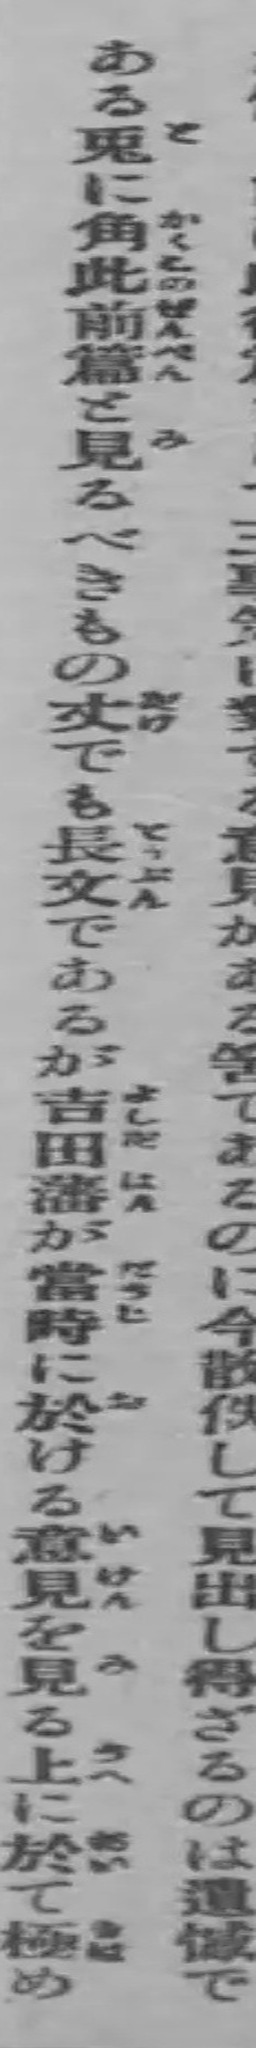ある兎に角此前篇と見るべきもの丈でも長文であるが吉田藩が当時に於ける意見を見る上に於て極め
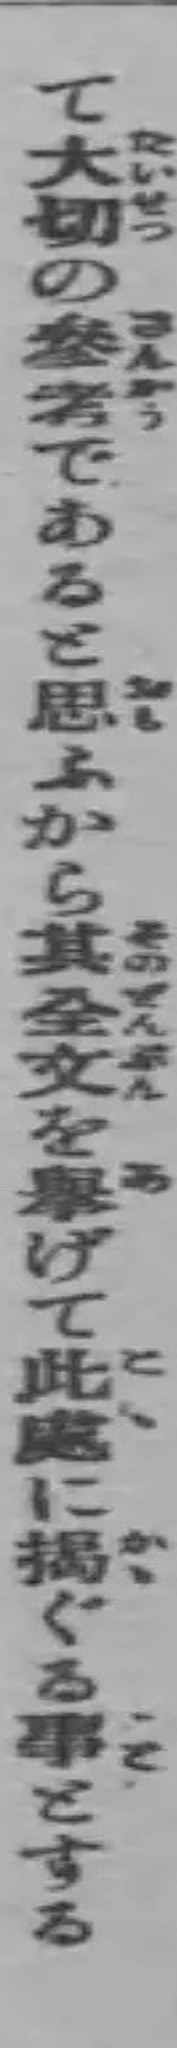て大切の参考であると思ふから其全文を挙げて此処に掲ぐる事とする
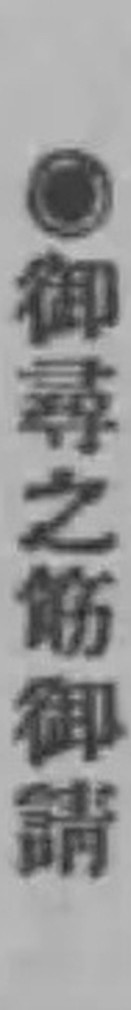⦿御尋之筋御請
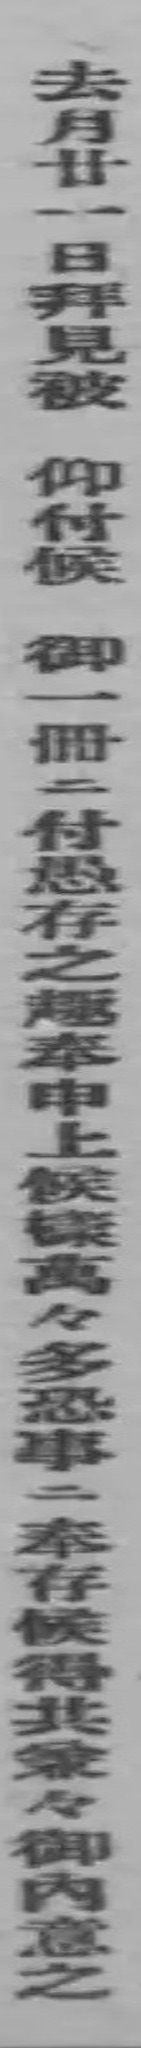去月廿一日拝見被仰付候御一冊ニ付愚存之趣奉申上候様万々多恐事ニ奉存候得共兼々御内意之
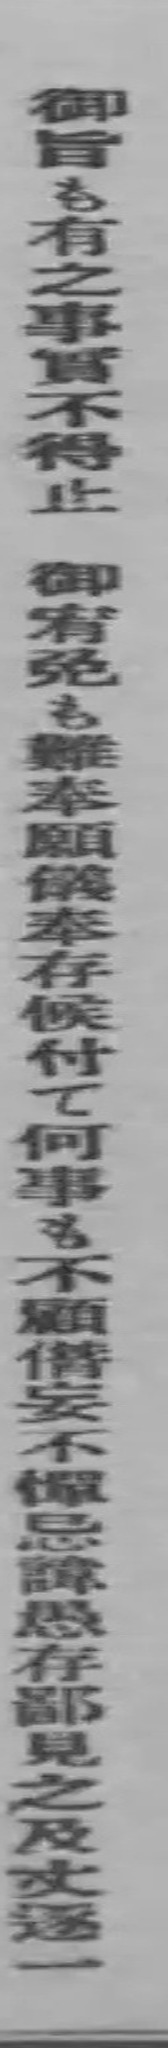御旨も有之事実不得止御宥免も難奉願儀奉存候付て何事も不顧偕妾不憚忌諱愚存鄙見之及丈逐一
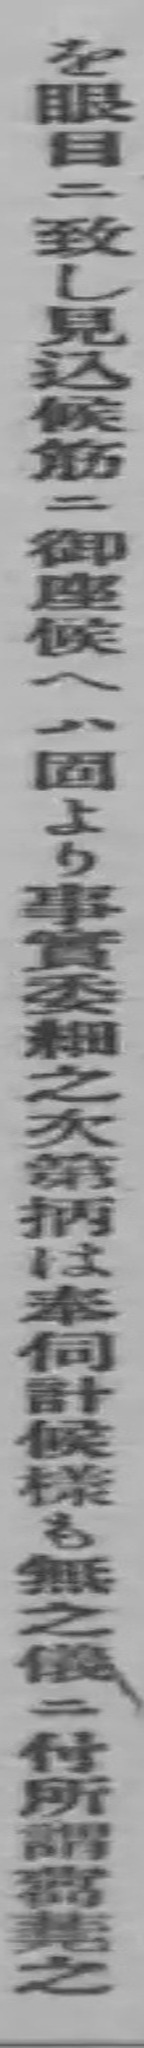を眼目ニ致し見込候筋ニ御座候ヘは固より事実委細之次第柄は奉伺計候様も無之儀ニ付所謂蕘之
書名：豊橋市史談
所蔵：国立国会図書館 National Diet Library, JAPAN
